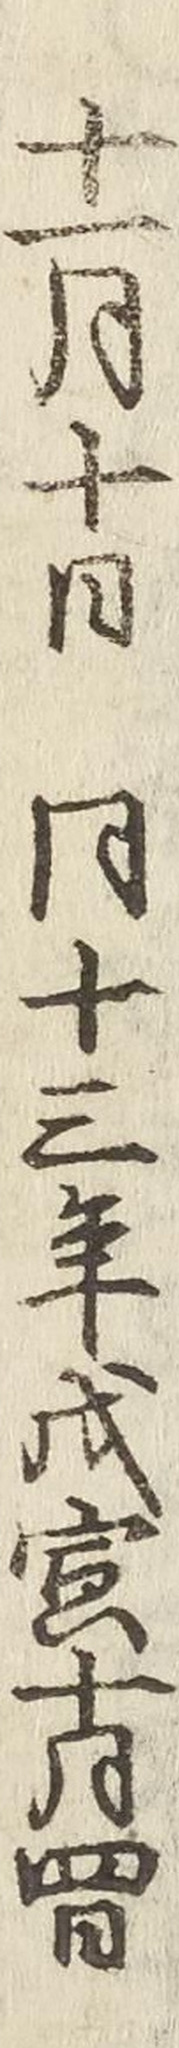十一月十日同十三年戌寅十月四日湖水

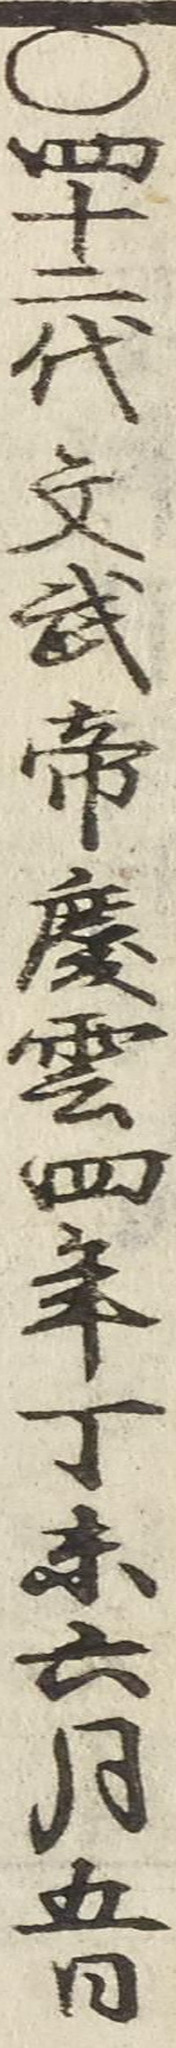○四十二代文武帝慶雲四年丁未六月五日
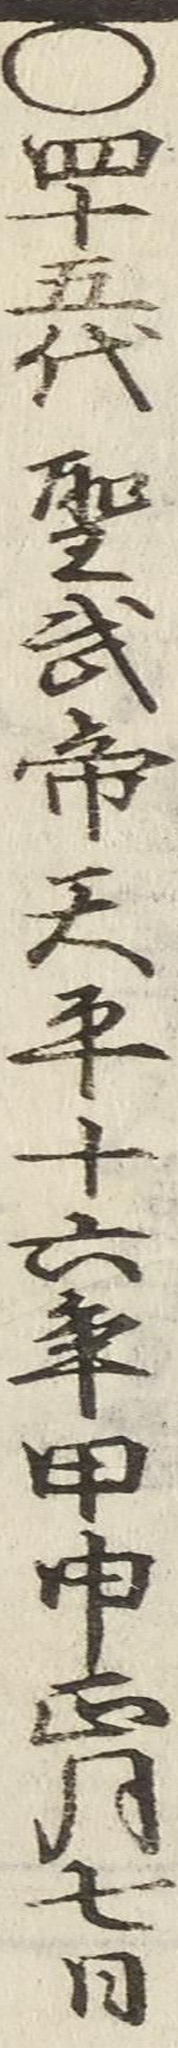○四十五代聖武帝天平十六年甲申正月七日
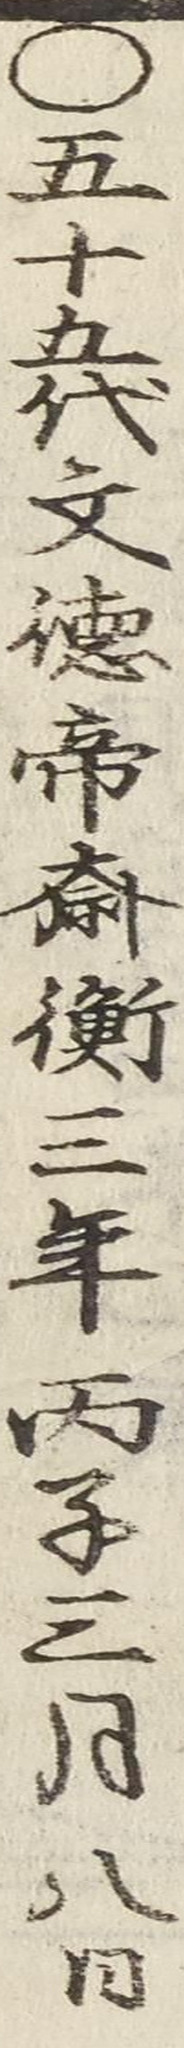○五十五代文徳帝斎衡三年丙子三月八日
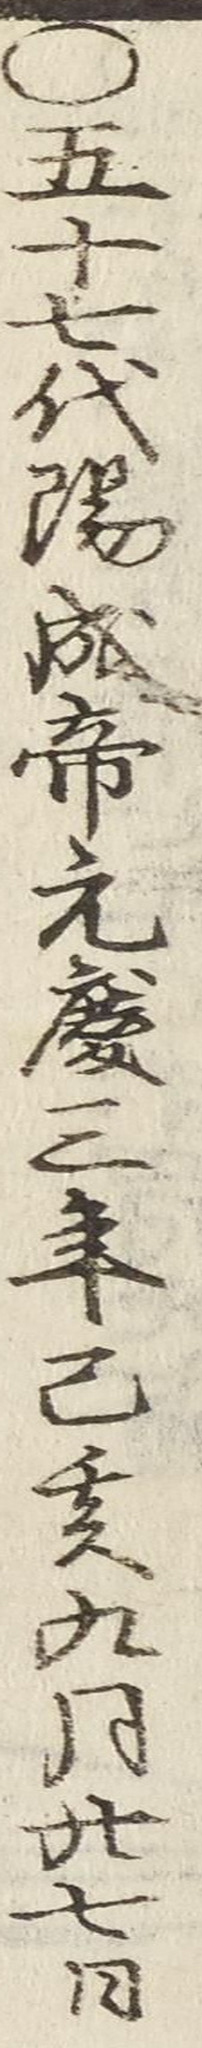○五十七代陽成帝元慶三年己亥九月廿七日竹生嶋
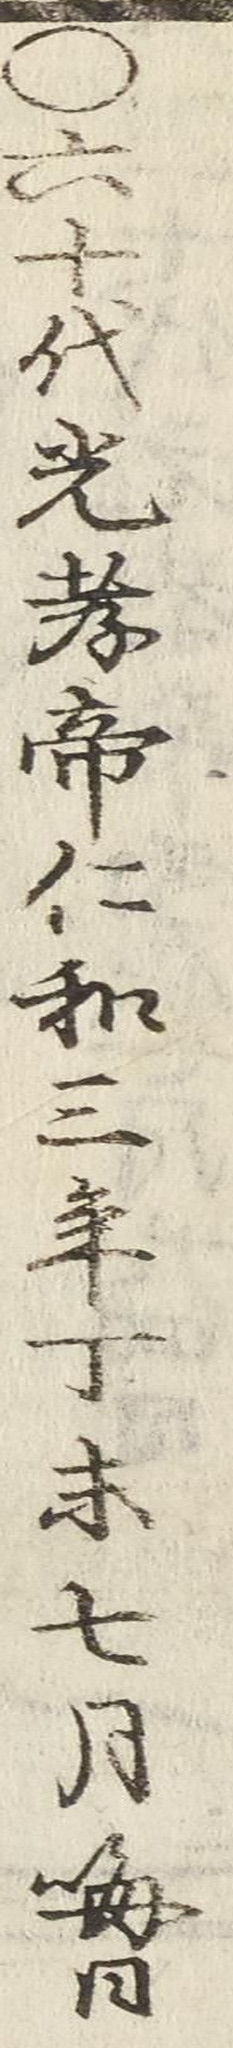○六十代光孝帝仁和三年丁未七月晦日
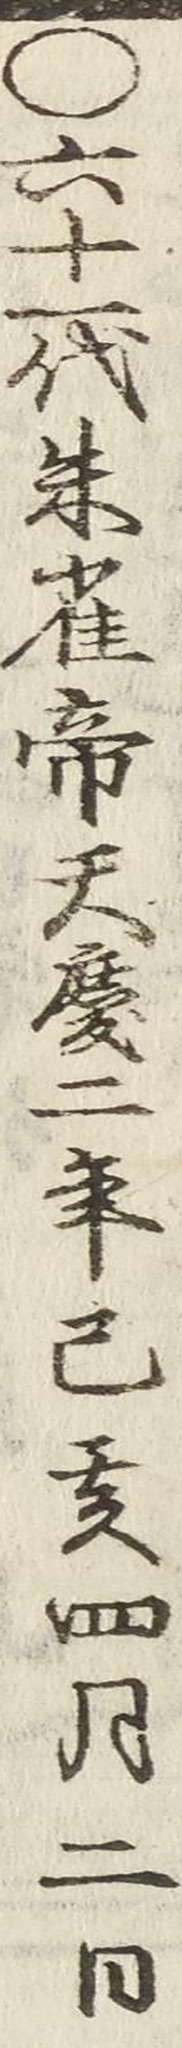○六十一代朱雀帝天慶二年己亥四月二日
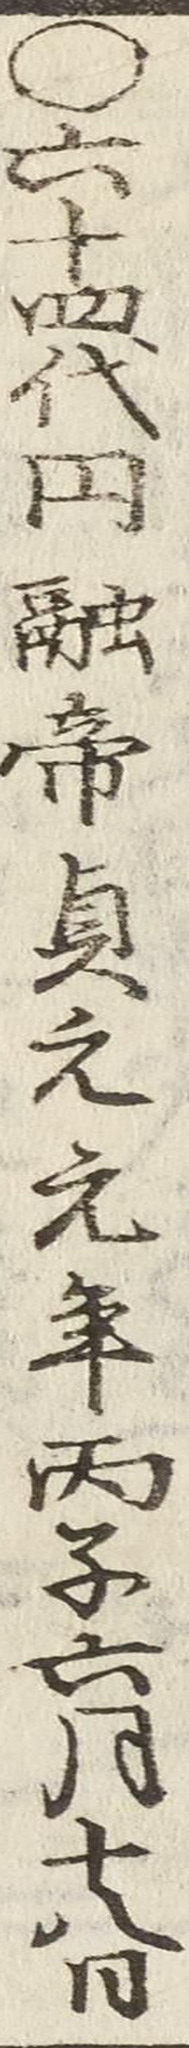○六十四代円融帝貞元元年丙子六月十八日
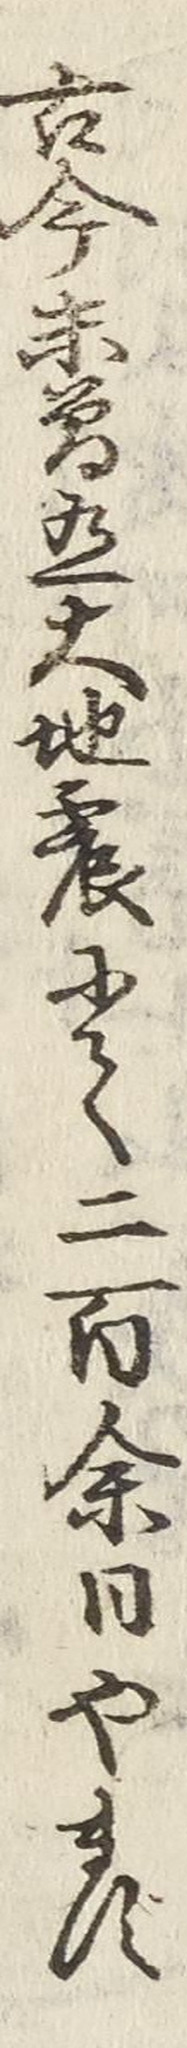古今未曽有大地震にて二百余日やまず
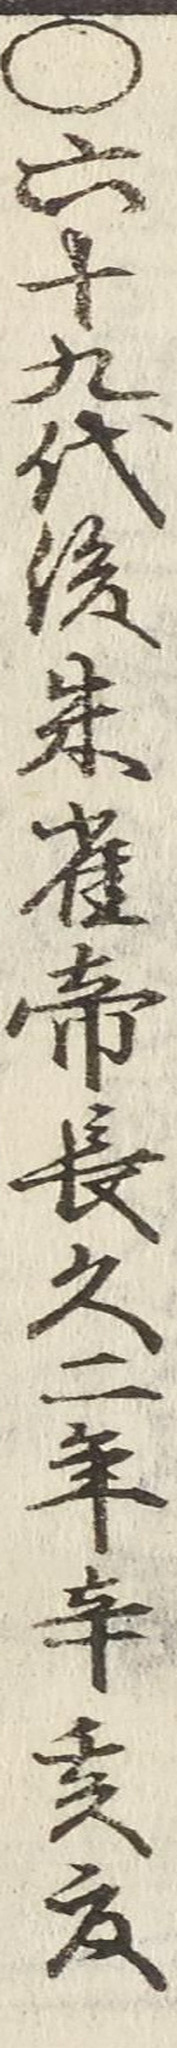○六十九代後朱雀帝長久二年辛亥夏
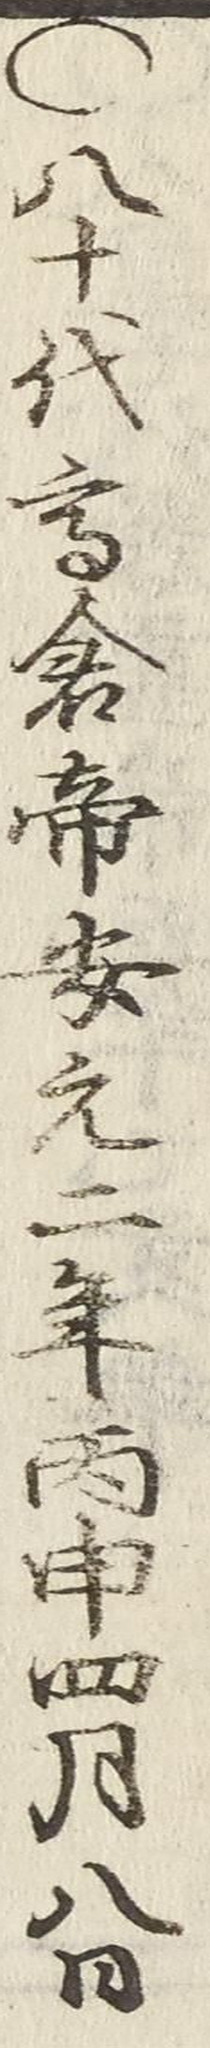○八十代髙倉帝安元二年丙申四月八日
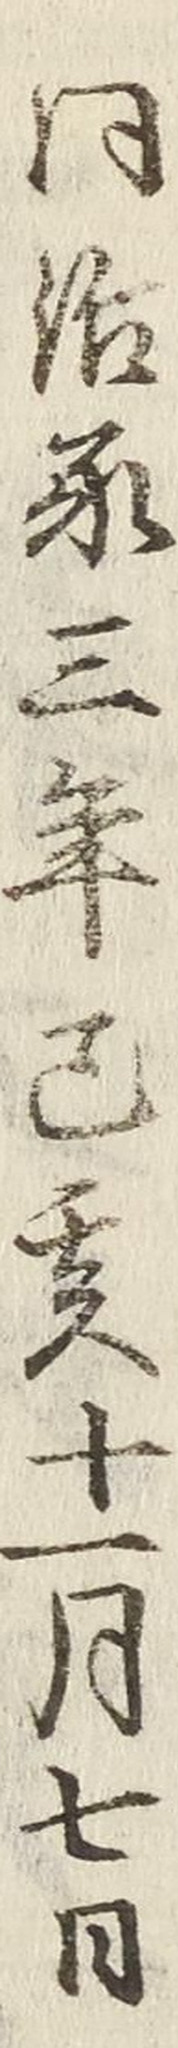同治承三年己亥十一月七日
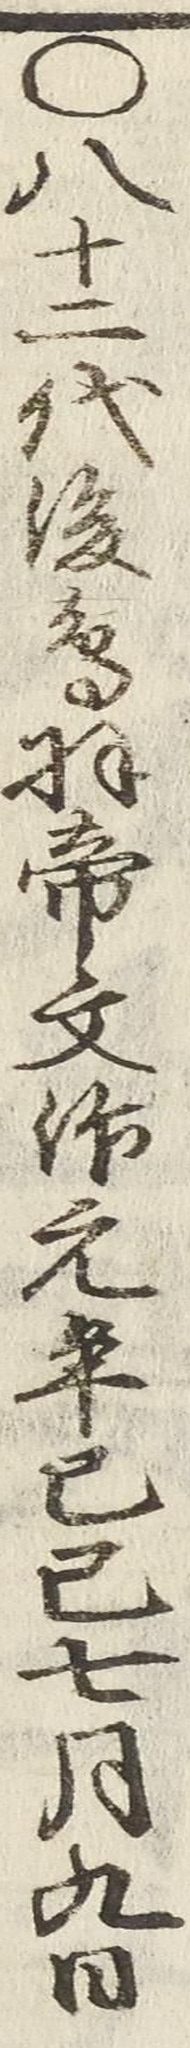○八十二代後鳥羽帝文治元年己巳七月九日
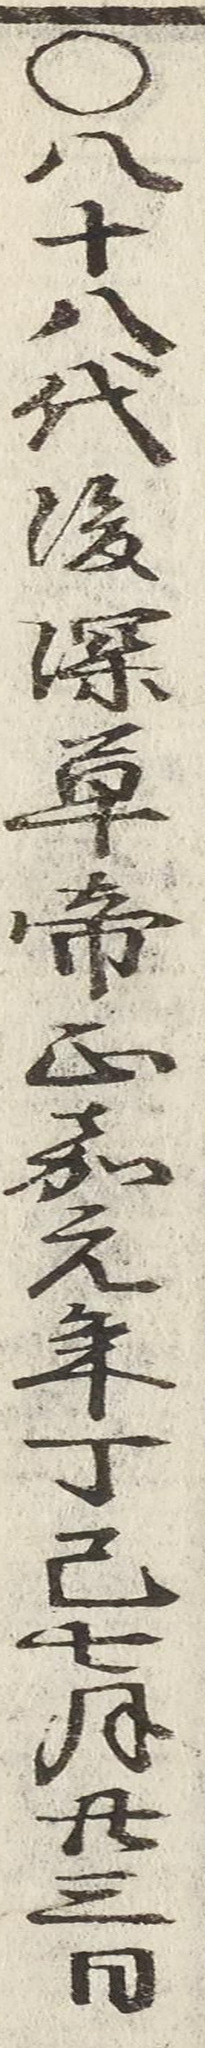○八十八代後深草帝正嘉元年丁己七月廿三日
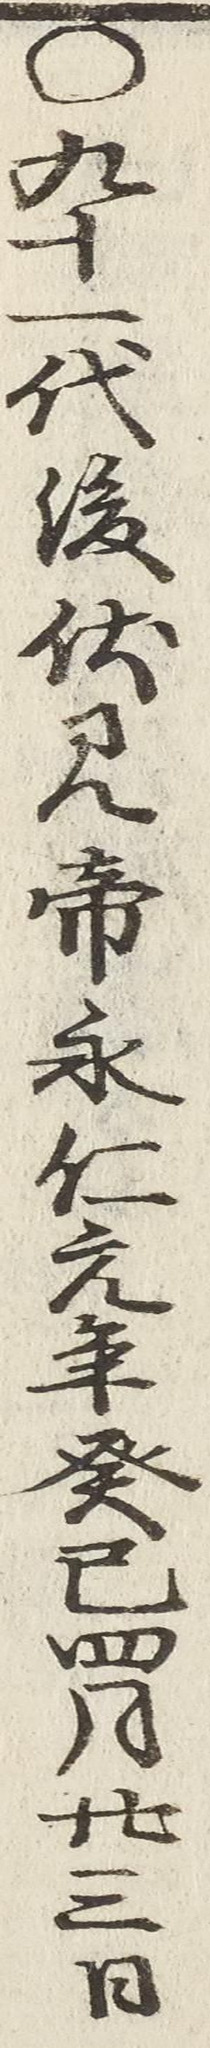○九十一代後伏見帝永仁元年癸巳四月廿三日
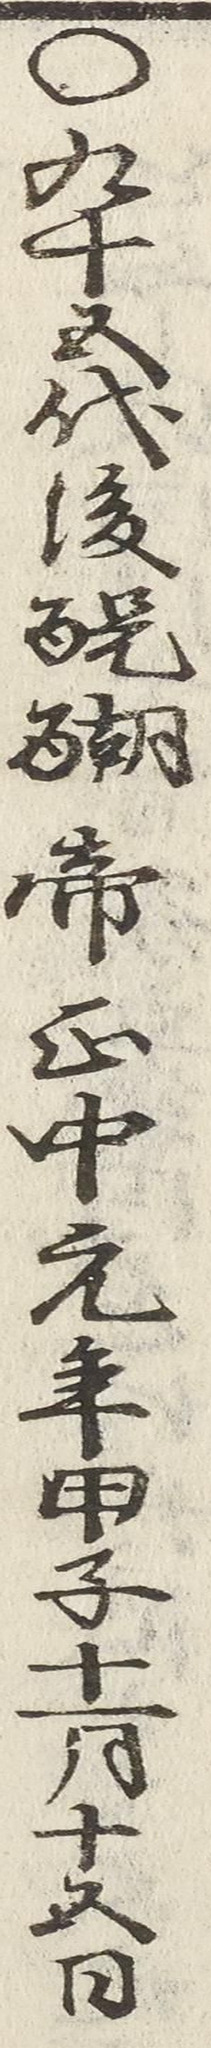○九十五代後醍醐帝正中元年甲子十一月十五日
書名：大地震世直仕艸紙
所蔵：東京大学地震研究所図書室 Earthquake Research Institute Library, The University of Tokyo, JAPAN
